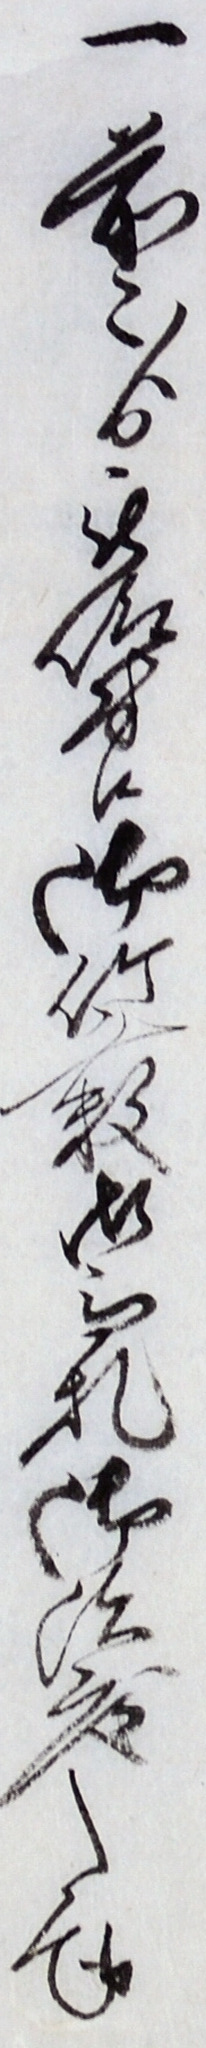一前々ゟ被仰付候御竹薮御高札御法度之趣
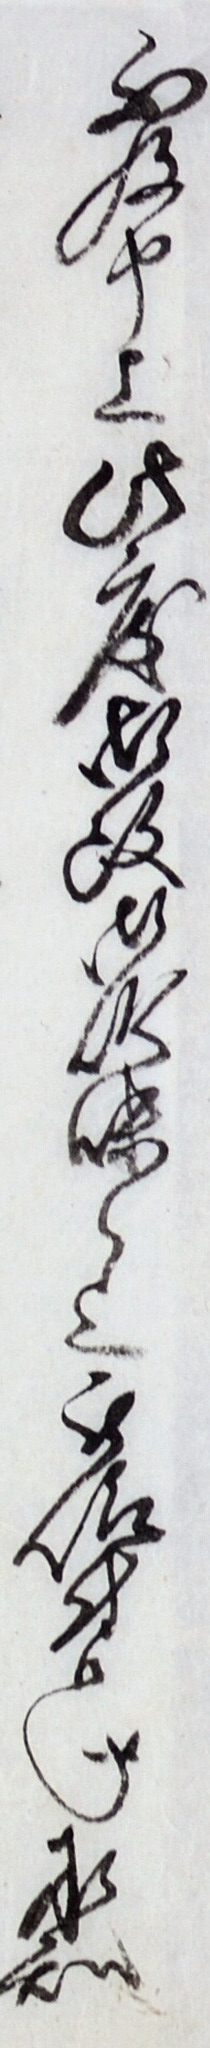不及申上此度御改御吟味之上被仰付候趣承知
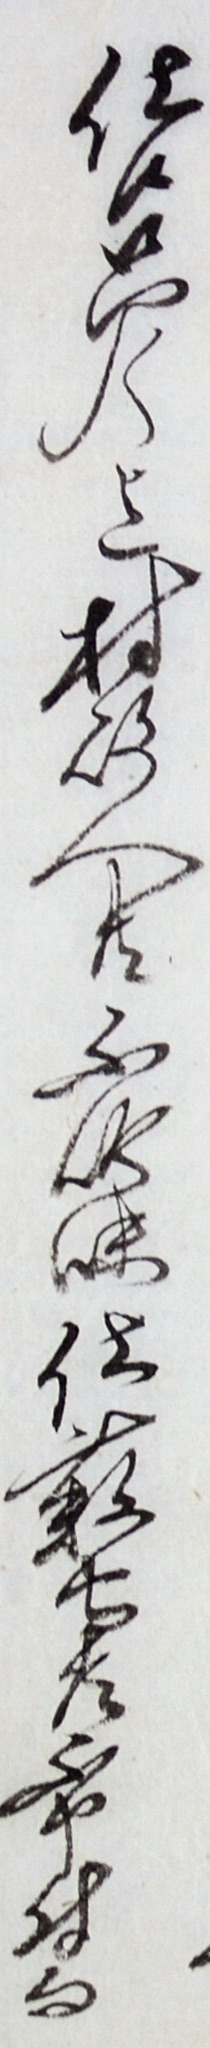仕候只今迄村役人共不吟味仕薮守共不申付而

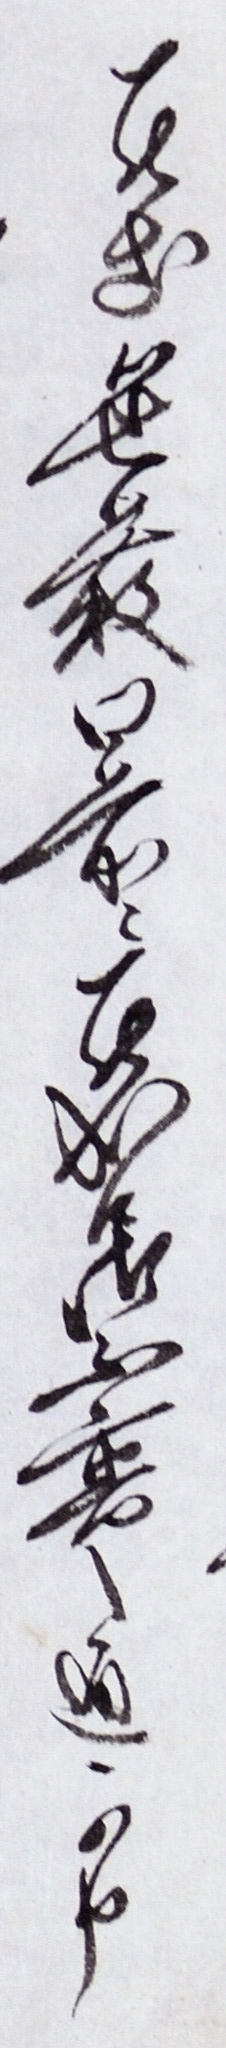罷出笹薮同前ニ罷成候御不審之通可申
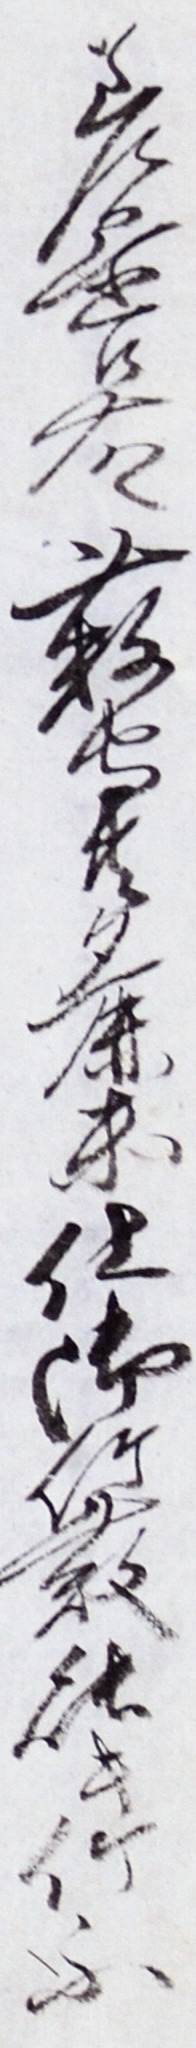差置候故薮守共麁末仕御竹薮能キ竹不
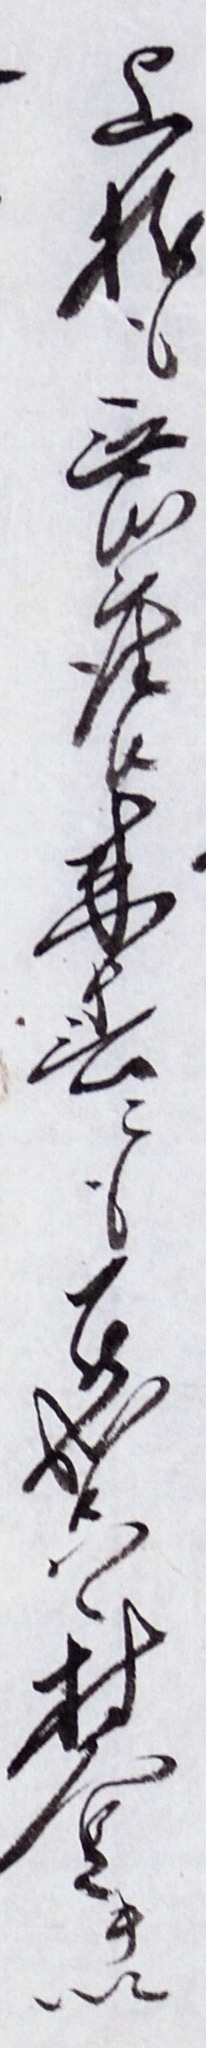上様も無御座候来春ニも罷成候ハヽ村人共ヲ以
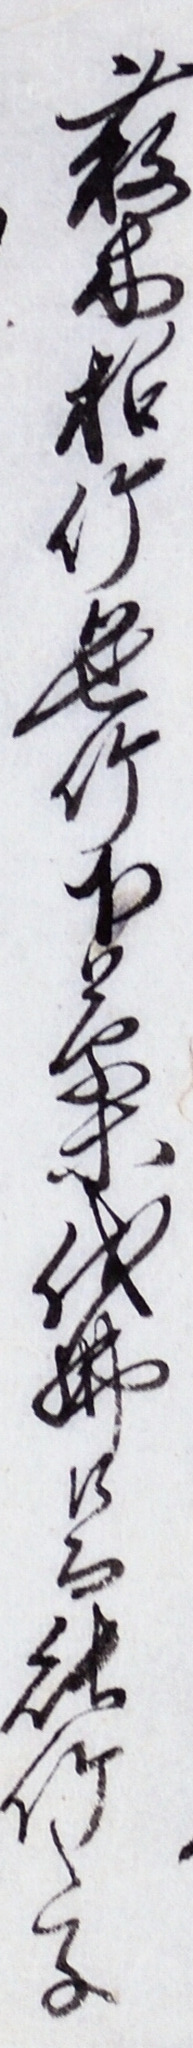薮木枯竹笹竹下草等伐払候而能竹之子
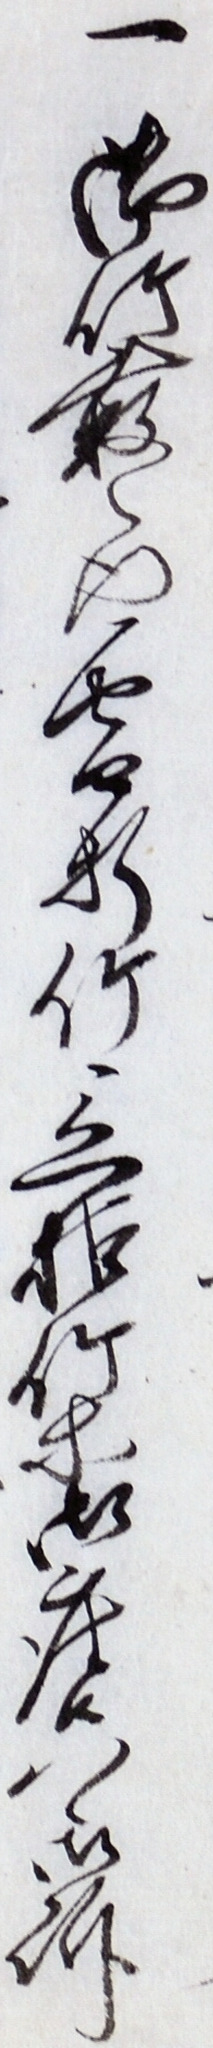一御竹薮之内雪折竹立枯竹等御座候ハヽ御訴
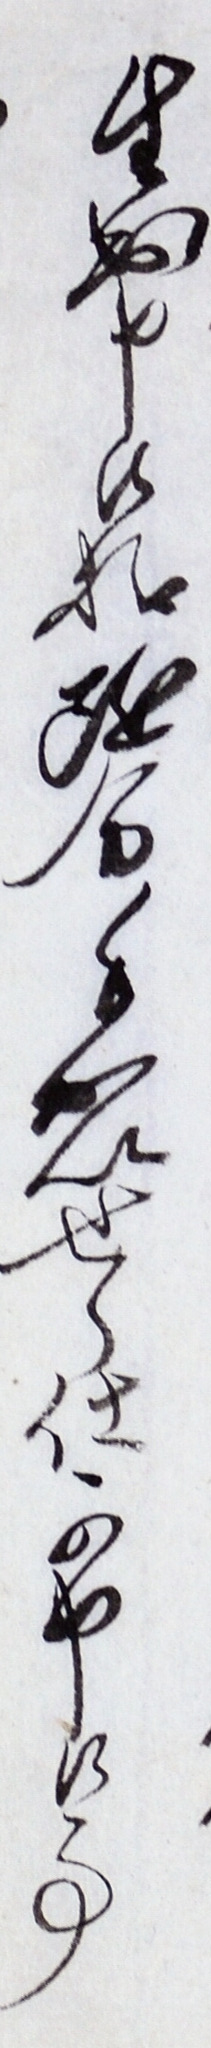生出申候様随分手かいせう仕可申候事
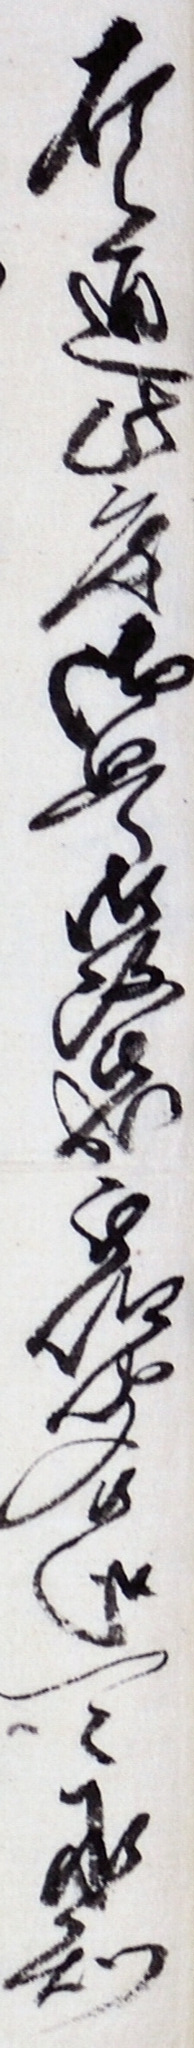右之通此度御廻り御改被成被仰聞候趣一々承知
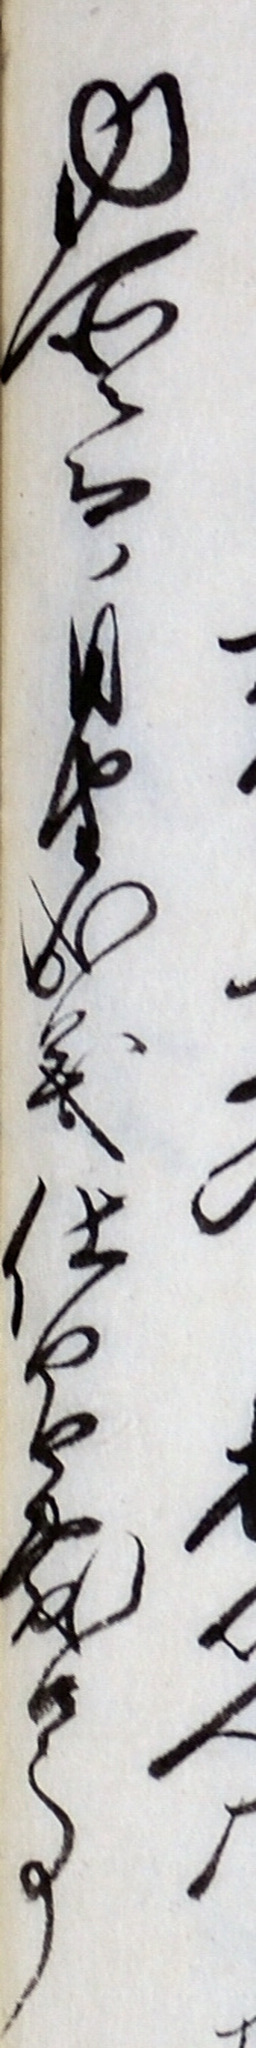内所ニ而自由成義仕間敷候事
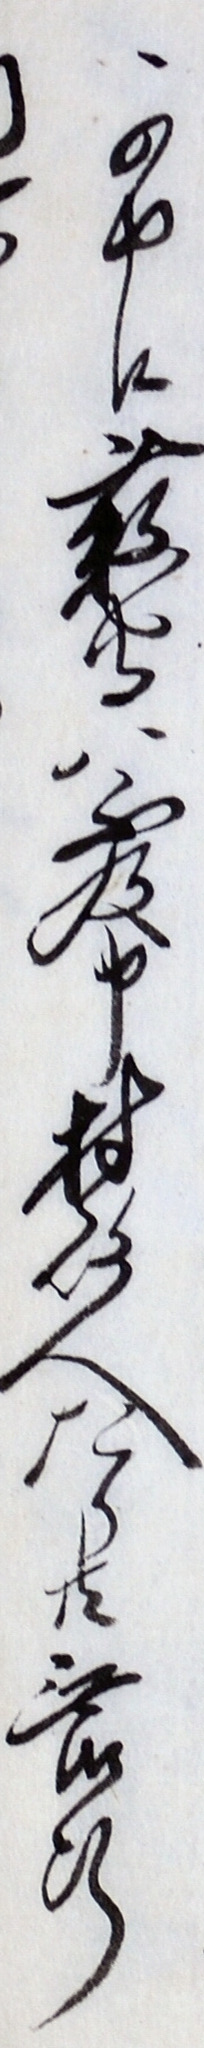可申候薮守ハ不及申村役人たり共無御断
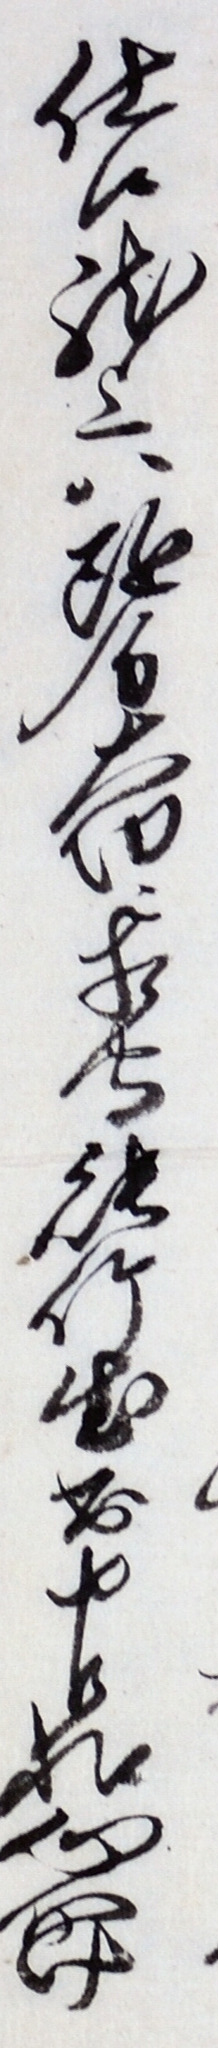仕候然上ハ随分大切ニ相守能竹生出申候様心かけ
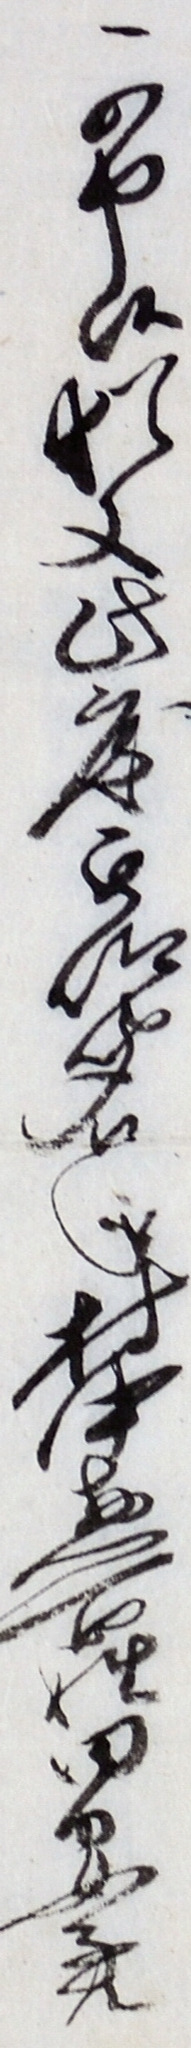可申候猶又此度被仰聞候趣村中惣百姓男女子共
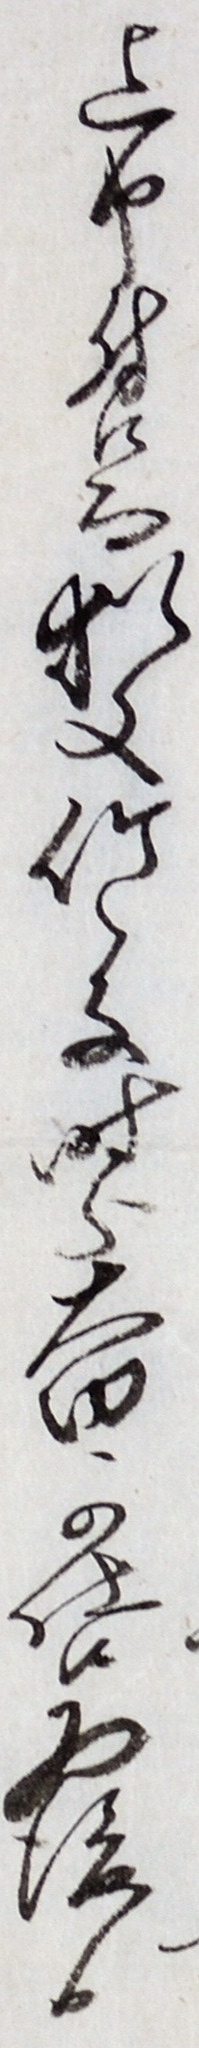迄申付候而猶又竹之子時分大切ニ可仕候為後日
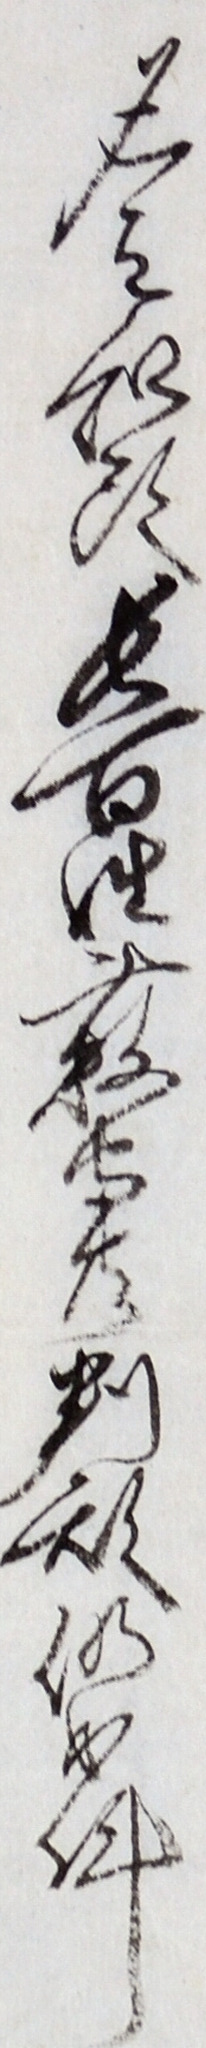名主組頭長百姓薮守共判形仍如件
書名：御林御竹藪証文控
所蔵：伊那市立高遠町図書館・合同会社AMANE
